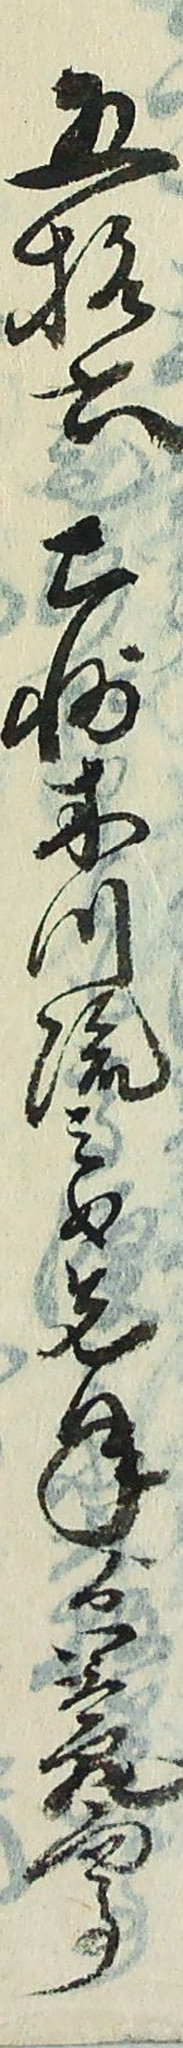五拾六土州木川流之義先年ゟ御取究向事
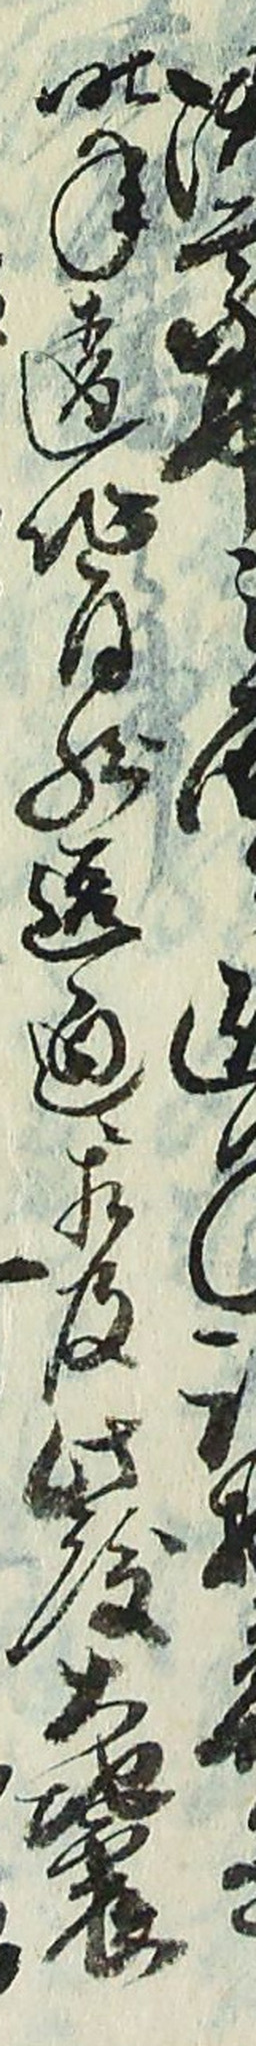昨年違作自然逼迫ニ相及此度大地震
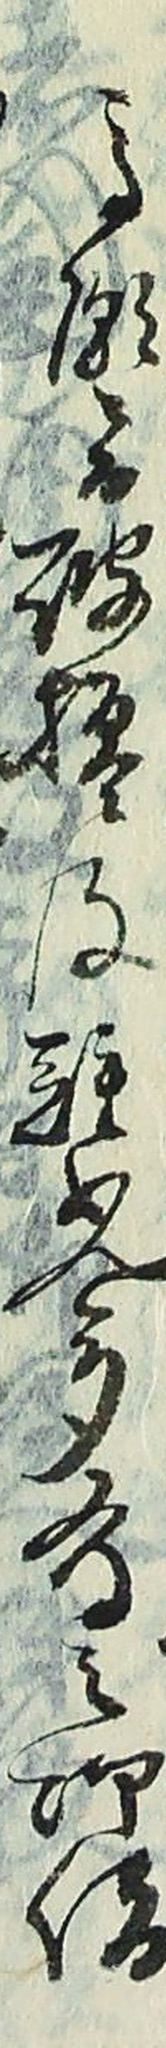高潮ニ而破損ニ及難義人多有之御借
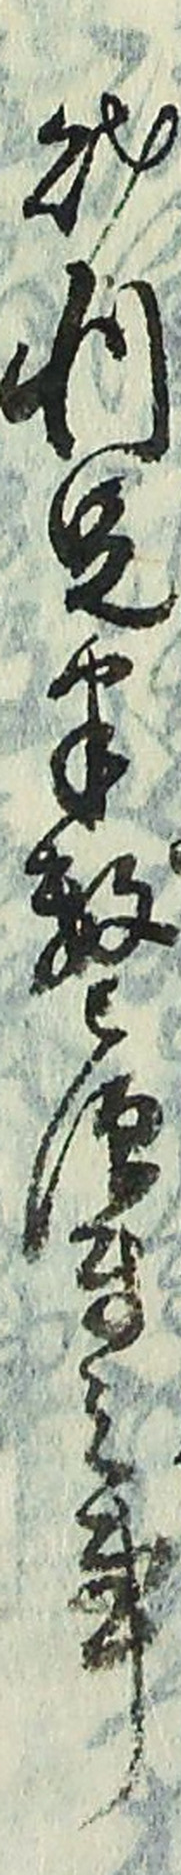財利足半数被仰付之事
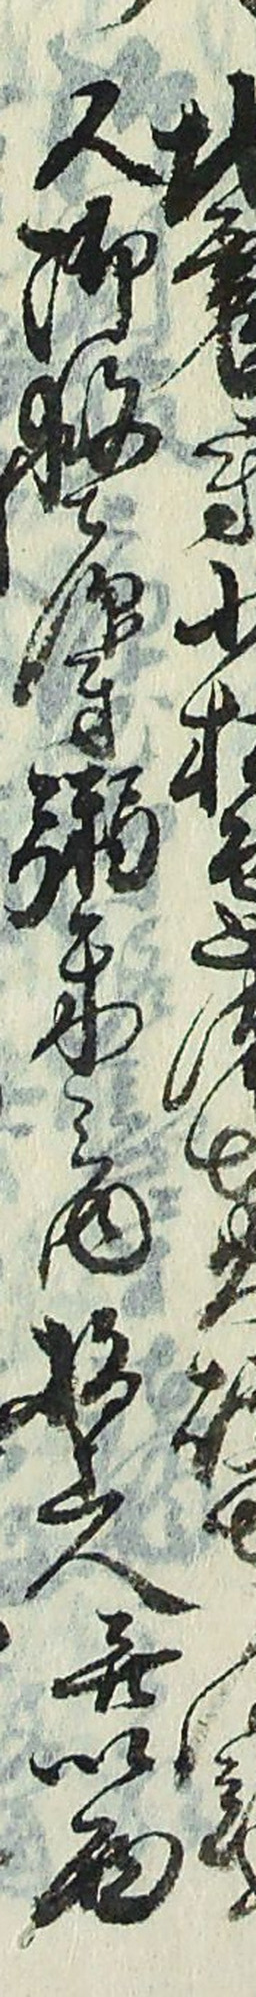人御救被仰付粥米之内指上人幷以面
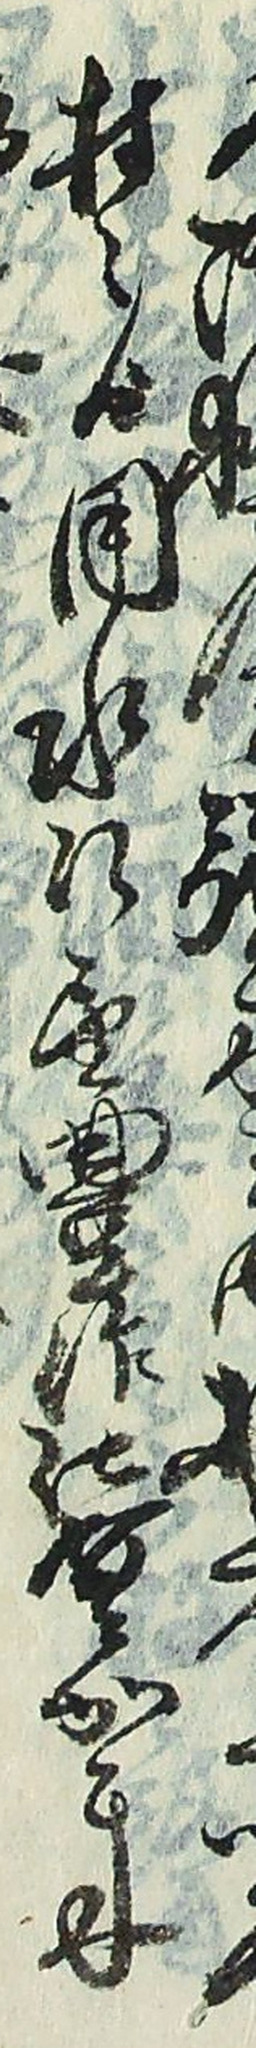村々ゟ用水引届豊作仕冥加米
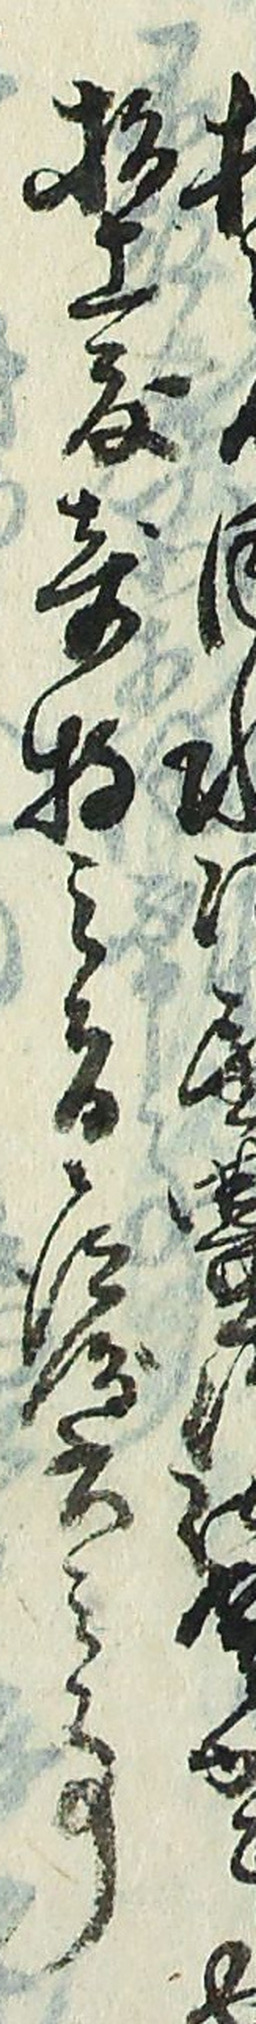指上度寄持之旨被仰渡書之事
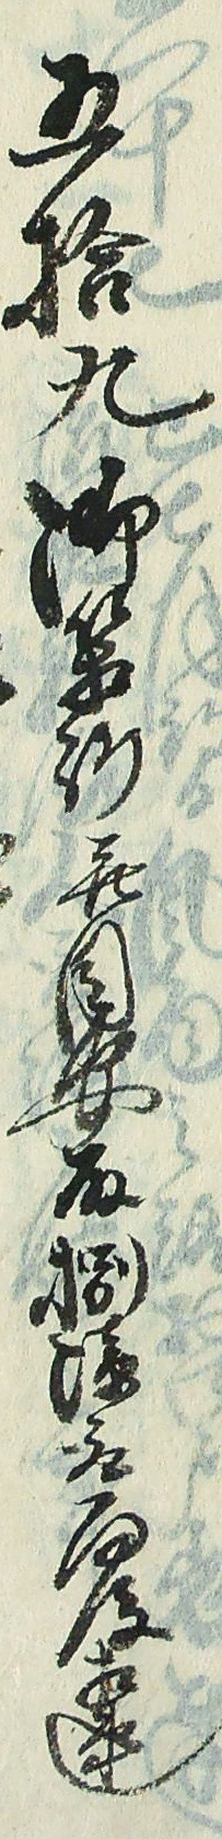五拾九御箱訴幷目安取捌隙取向後相速
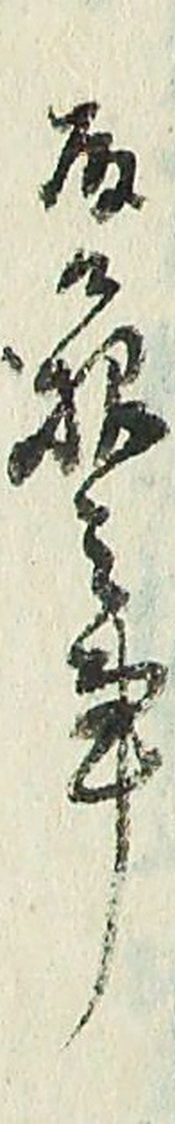取候様之事

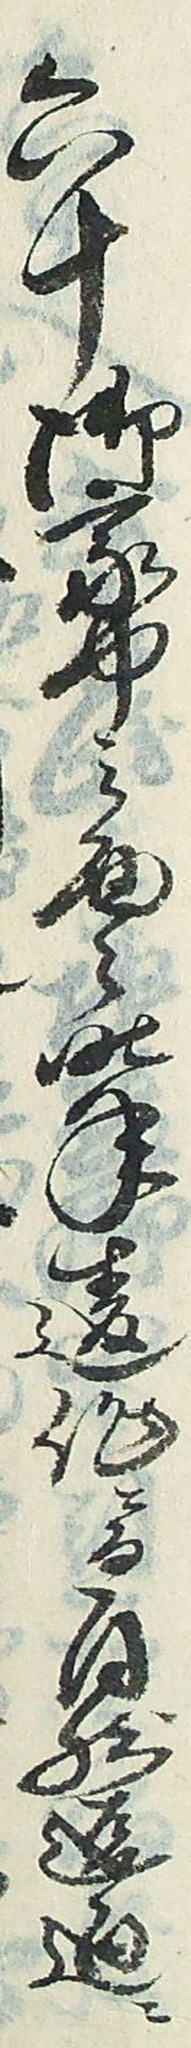六十御家中之面々昨年違作ニ而自然逼迫ニ
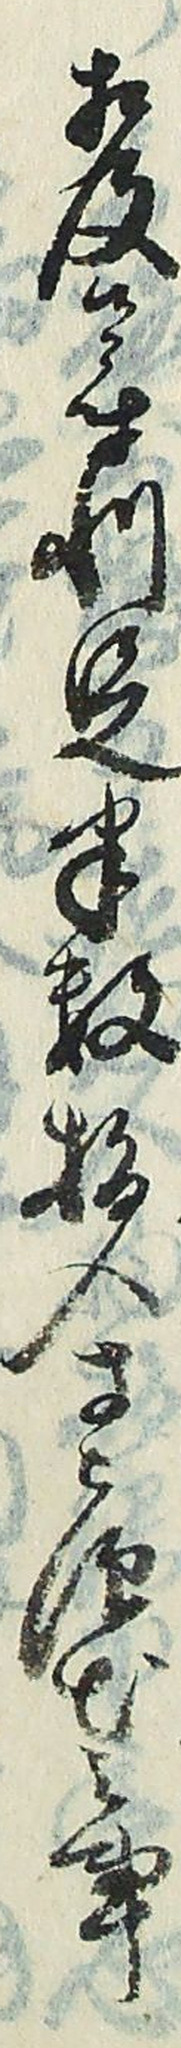相及候ニ付利足半数指入方被仰出之事
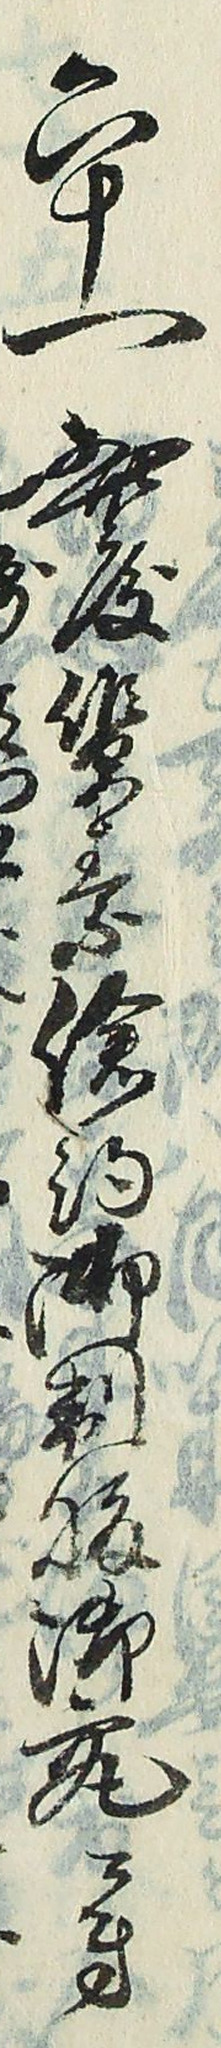六十一此度質素倹約御制服御究ニ付
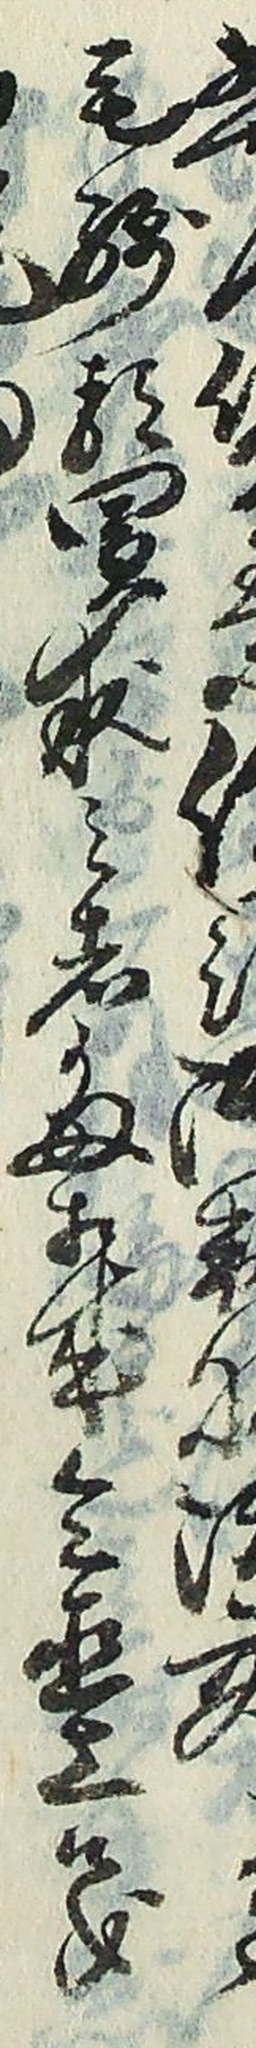毛綿類買求之者多相成令直上候義
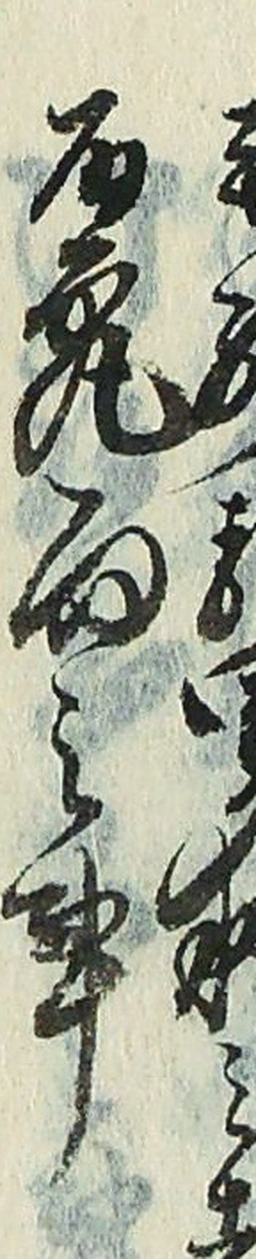取究向之事
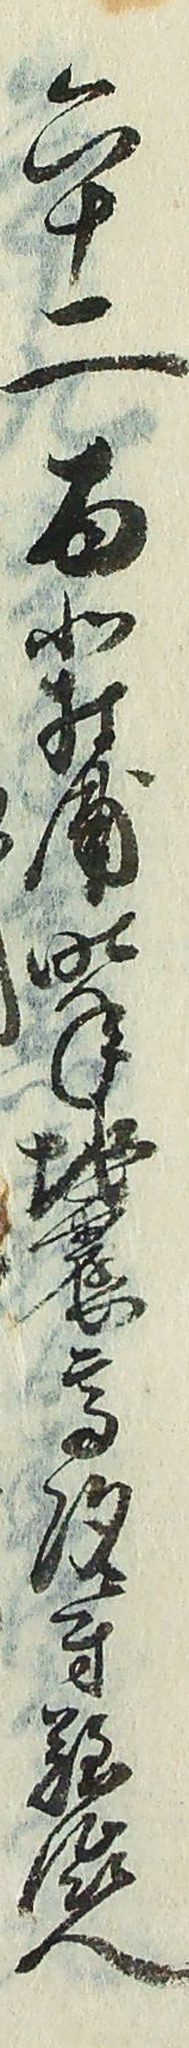六十二南北村浦昨年地震高汐ニ付難渋人
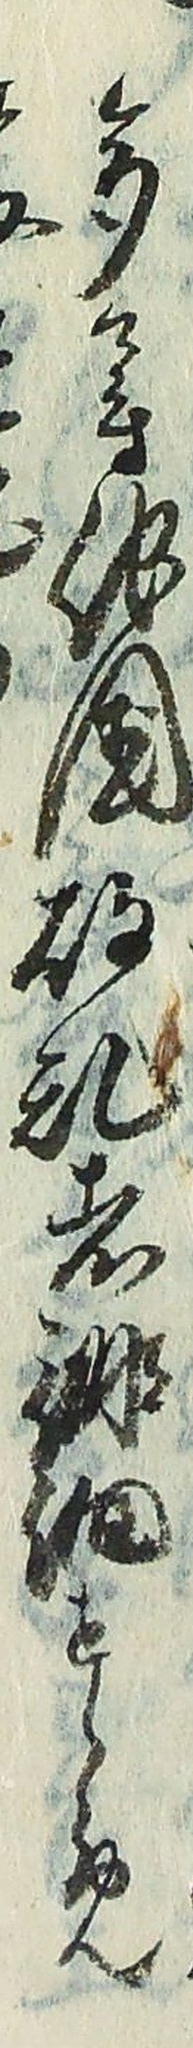多候ニ付他国胡乱者徘徊せしめ
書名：諸御趣意書并御下知向之写
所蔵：鳴門教育大学 Naruto University of Education
